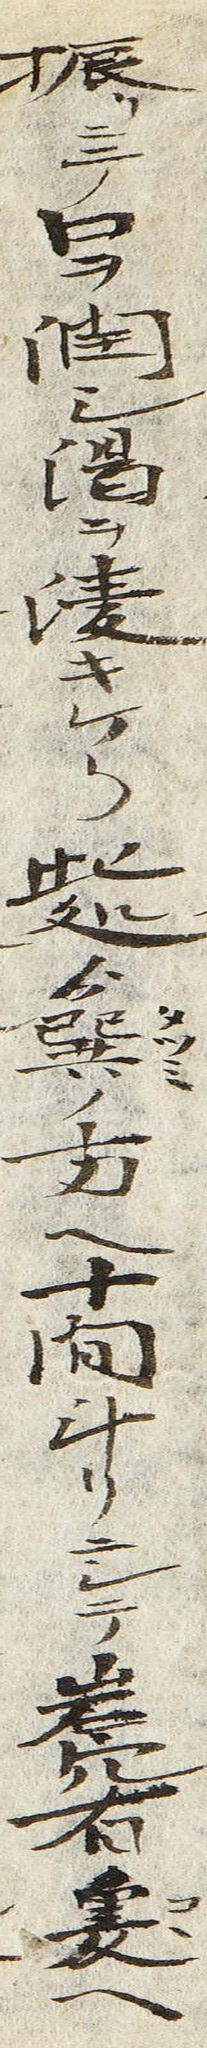振ニテ口ヲ潤シ渇を凌キケリ此処ゟ巽ノ方へ十間計リニシテ岩穴有爰ヘ
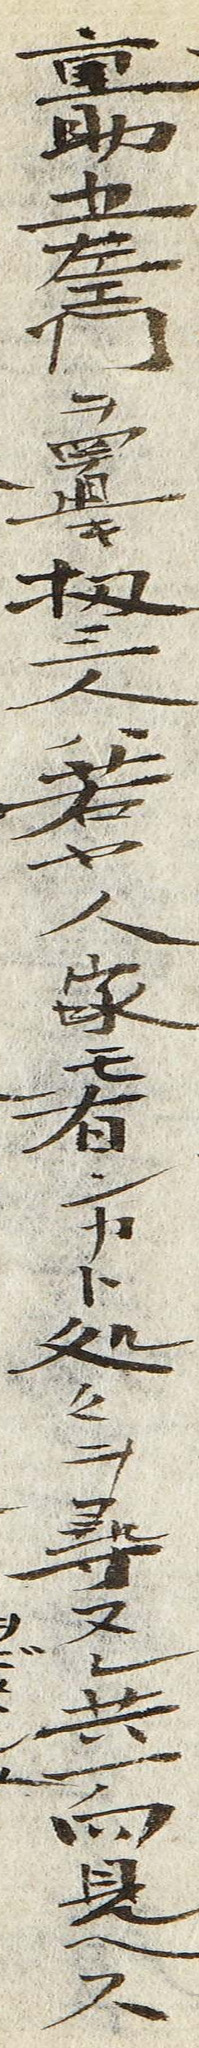重助五左衛門ヲ置キ扨三人ハ若ヤ人家モ有ンカト処々ヲ尋ヌレ共一向見へス
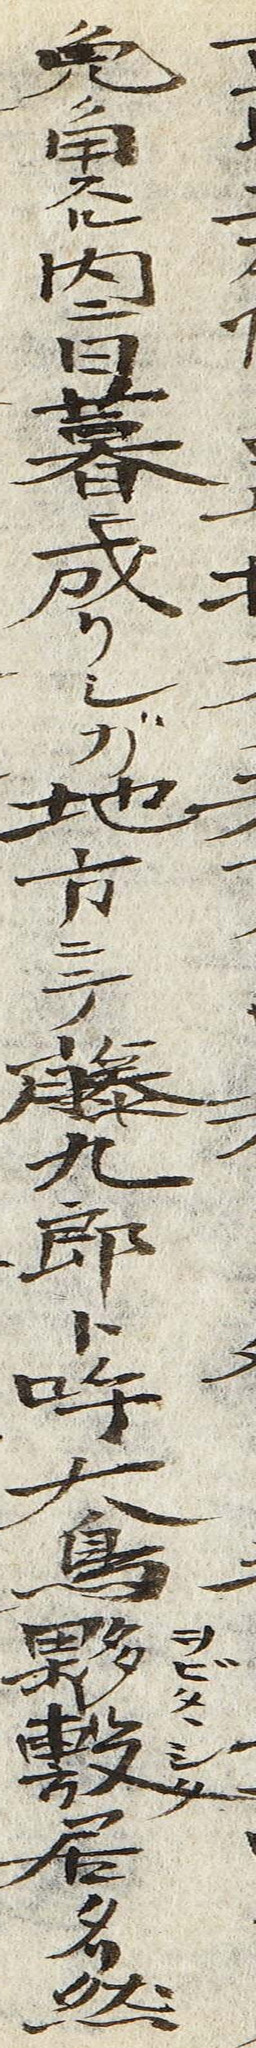兎角スル内ニ日暮ニ成リシガ地方ニテ藤九郎ト吽大鳥夥敷居タリ然
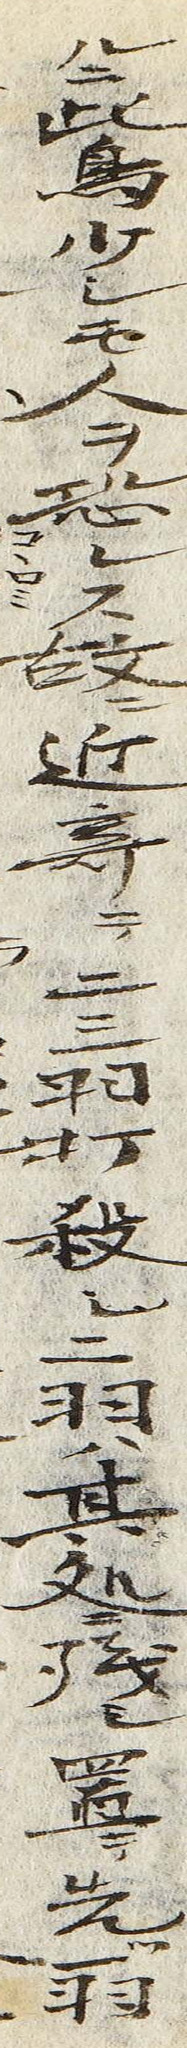ルニ此鳥少モ人ヲ恐レス故ニ近寄テ二三羽打殺シ二羽ハ其処ニ残シ置テ先ツ一羽
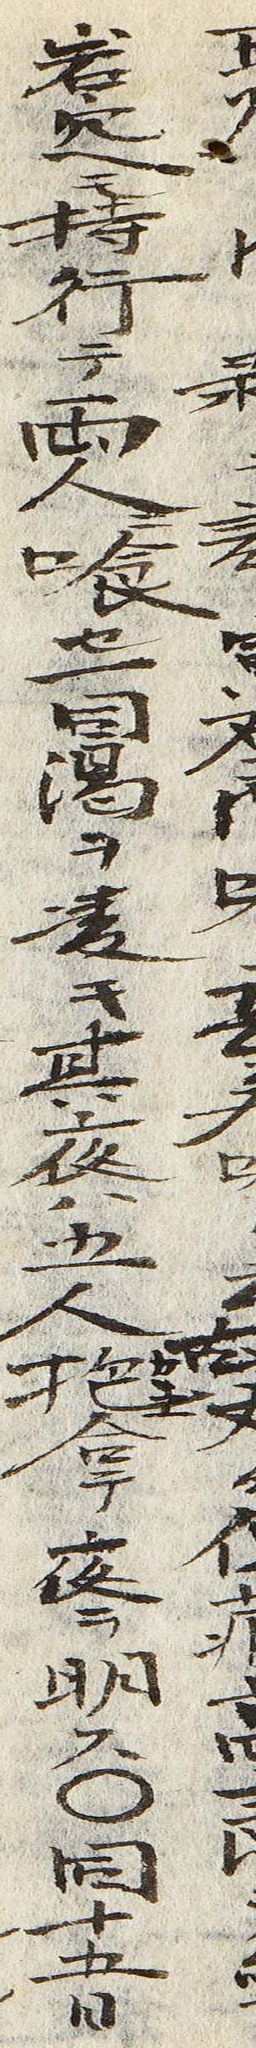岩穴ヘモ持行テ両人喰セ一同渇ヲ凌キ其夜ハ五人抱合テ夜ヲ明ス〇同十五日
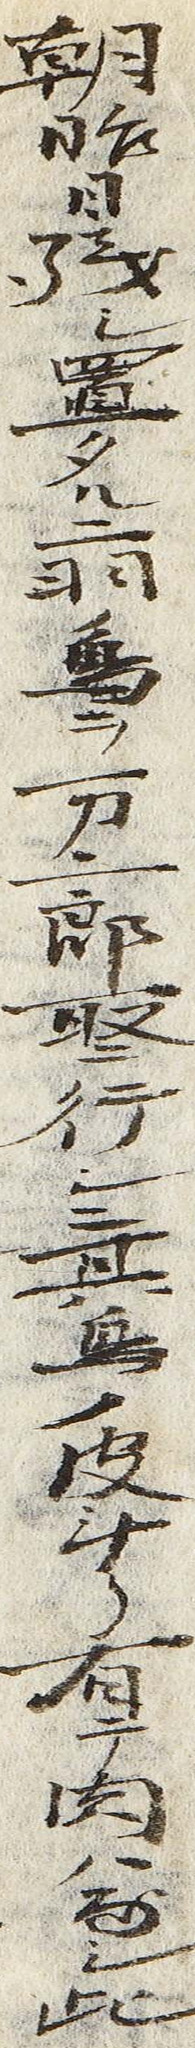朝昨日残シ置タル二羽鳥ヲ万二郎取ニ行シニ其鳥ノ皮計リ有テ肉ハなシ此
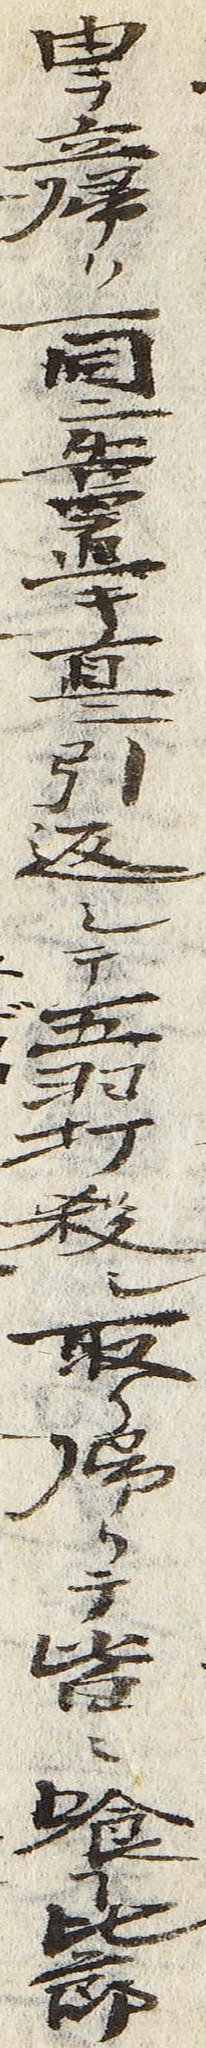由ヲ立帰リ一同ニ告置キ直ニ引返シテ五羽打殺シ取リ帰リテ皆々喰フ此節の
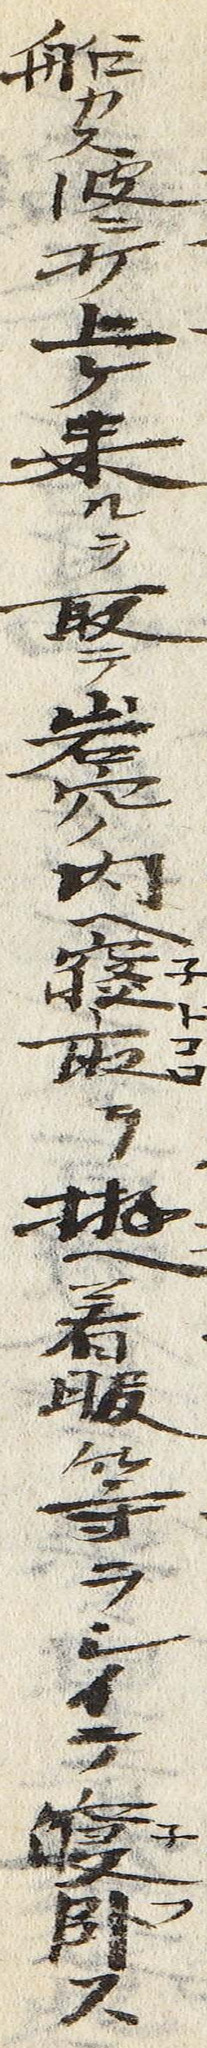船カス波ニ打上ケ来ルヲ取テ岩穴ノ内ヘ寝取ヲ拵ヘ着服等ヲシイテ寝臥ス
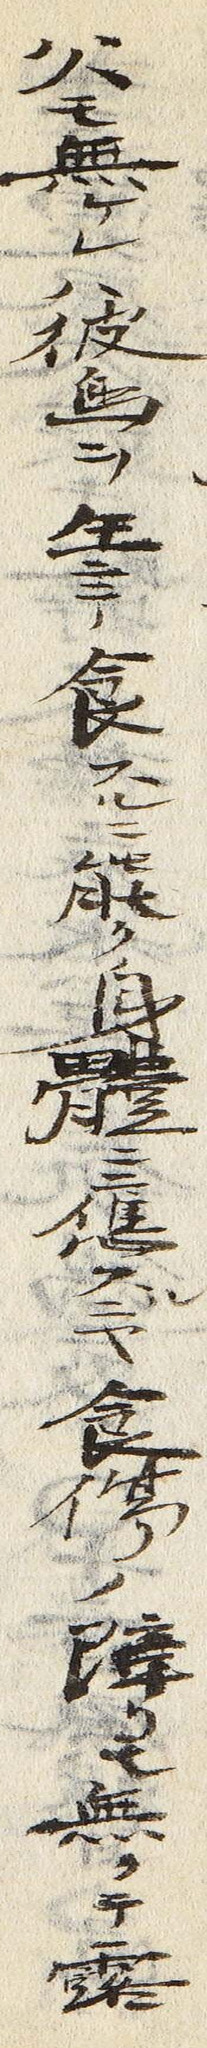ハ人モ無ケレハ彼島ヲ生ニテ食スルニ能ク身體ニ応スルニヤ食傷ノ障リモ無クテ露
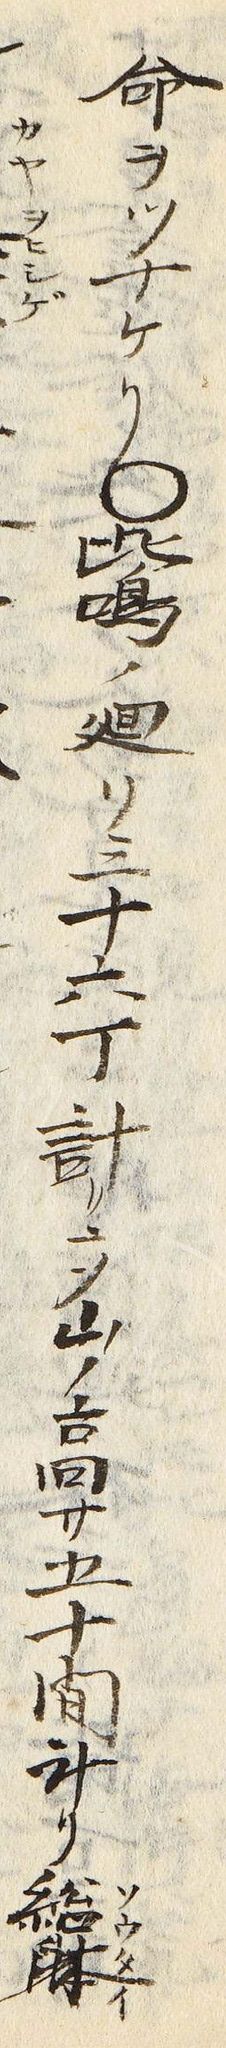命ヲツナケリ〇此嶋ノ廻リ三十六丁計リ山ノ高サ五十間計リ総体
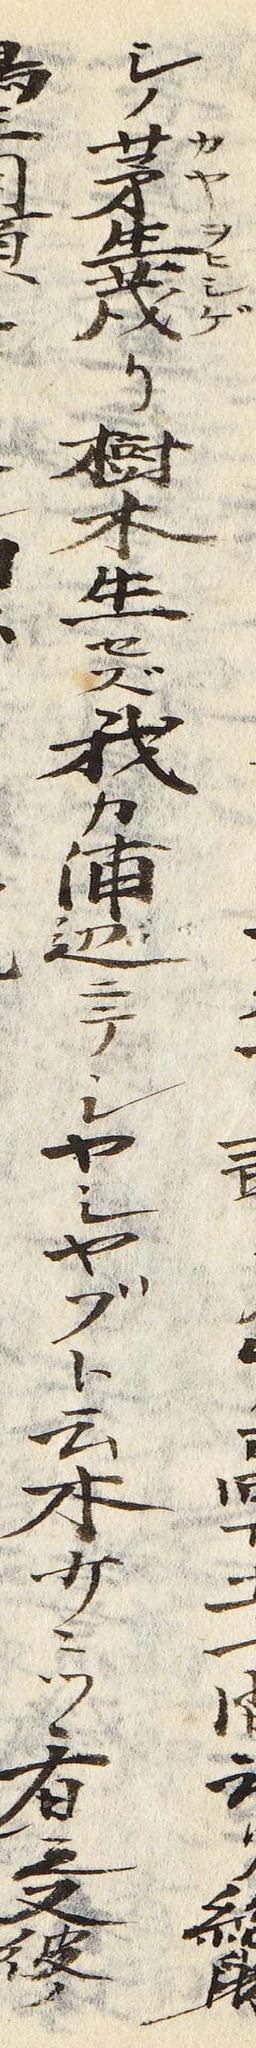シノ茅生茂り樹木生セズ我々浦辺ニテシヤシヤブト云木少々ツ丶有之又彼ノ
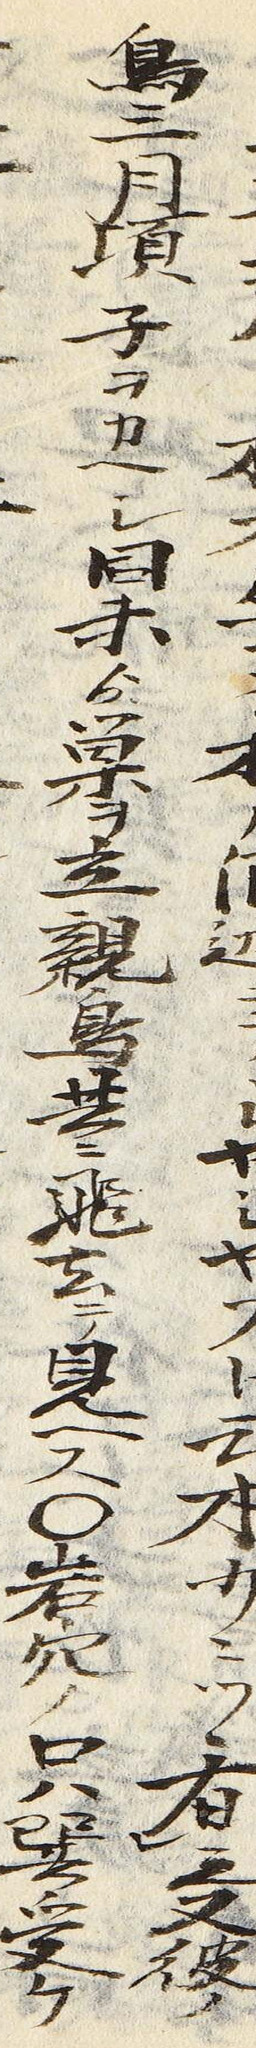鳥三月頃子ヲカヘシ同未ゟ巣ヲ立親鳥共ニ飛去テ見ヘス〇岩穴ノ口ハ巽受ケ
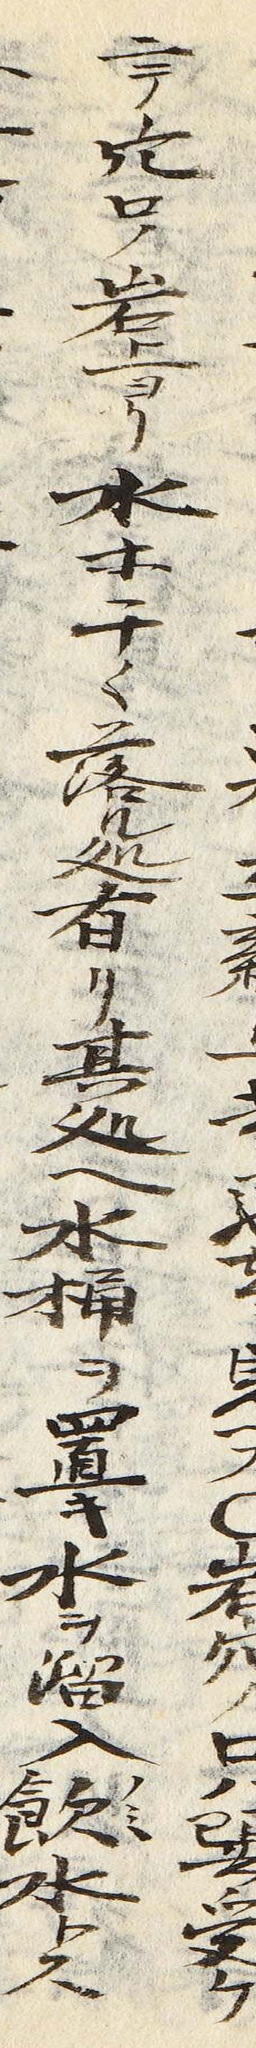ニテ穴口ノ岩上ヨリ水等く落ル処有リ其処へ水桶ヲ置キ水ヲ溜入
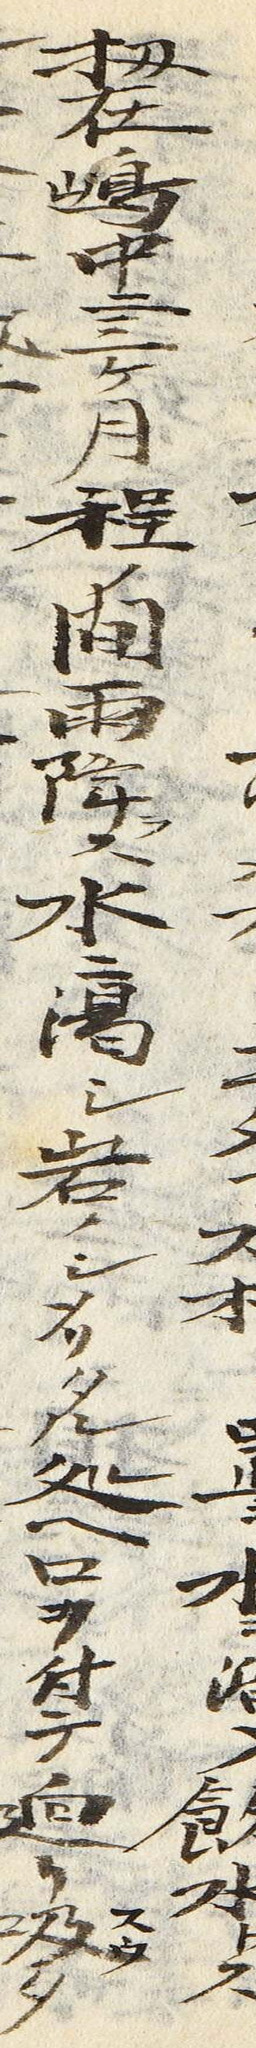扨在嶋中二三ヶ月程ノ間雨降ラス水ニ渇シ岩ノシメリタル処ヘ口ヲ付テ廻リ吸タ
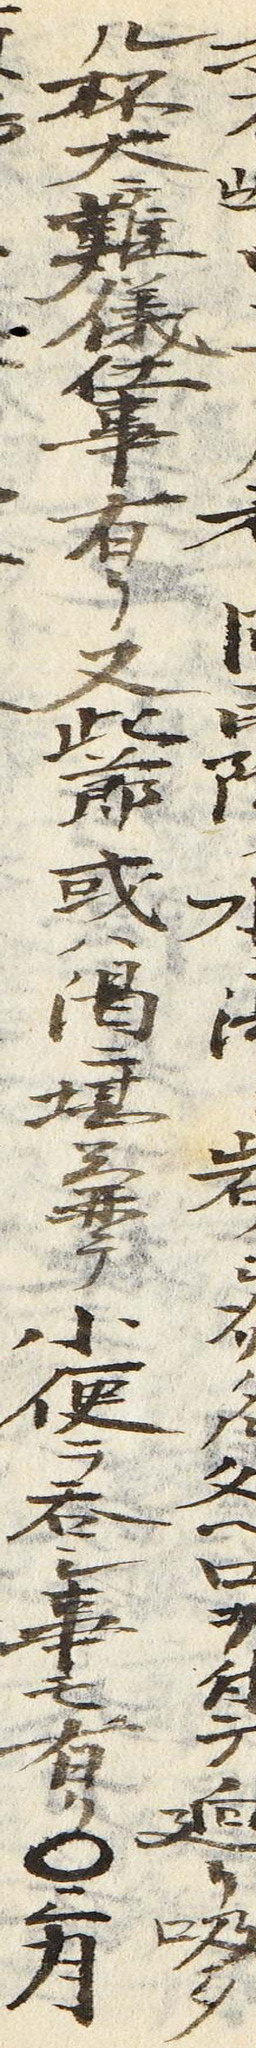ル抔大ニ難儀仕事有リ又此節或ハ渇ニ堪兼テ小便ヲ吞シ事モ有リ〇三月
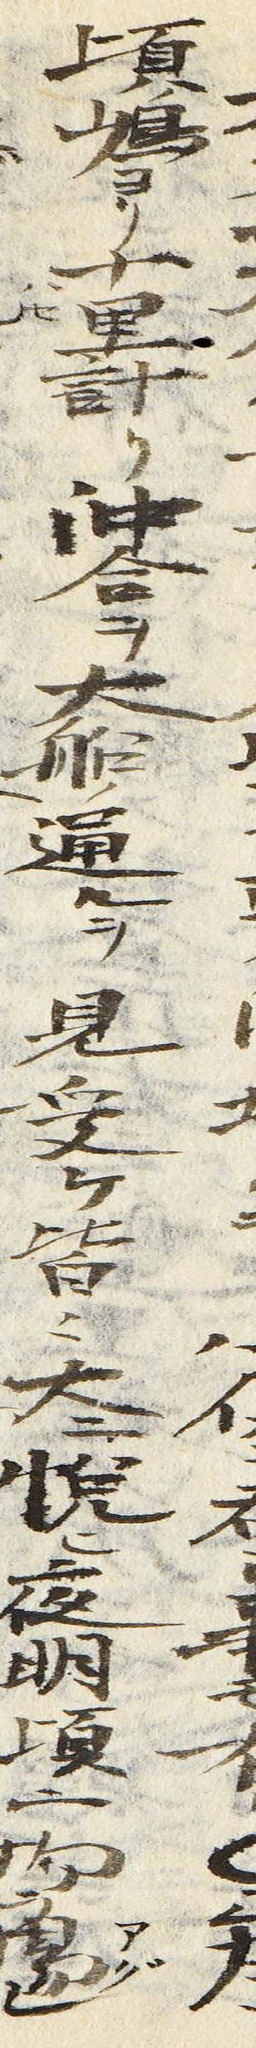頃嶋ヨリ十里計リ沖合ヨリ大船ノ通ルヲ見受ケ皆々大ニ悦ヒ夜明頃ニ物ヲ揚レ
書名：漂流記聞
